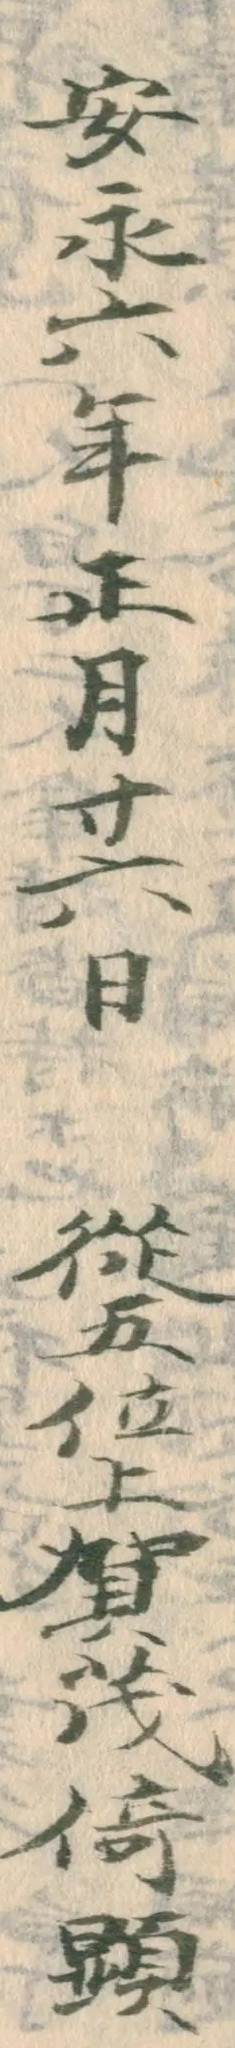安永六年正月廿六日従五位上賀茂倚顕
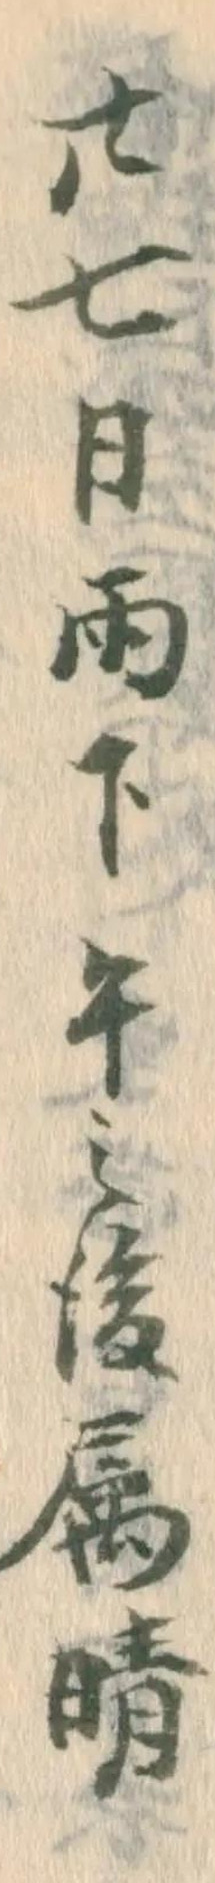廿七日雨下午之後属晴
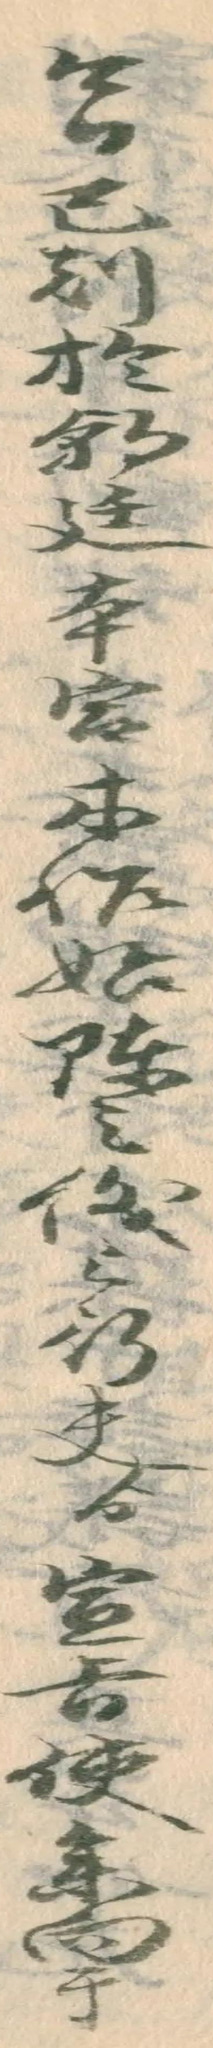一今日巳刻於朝廷本宮木作始陣之儀被行夫ゟ宣旨使参向于
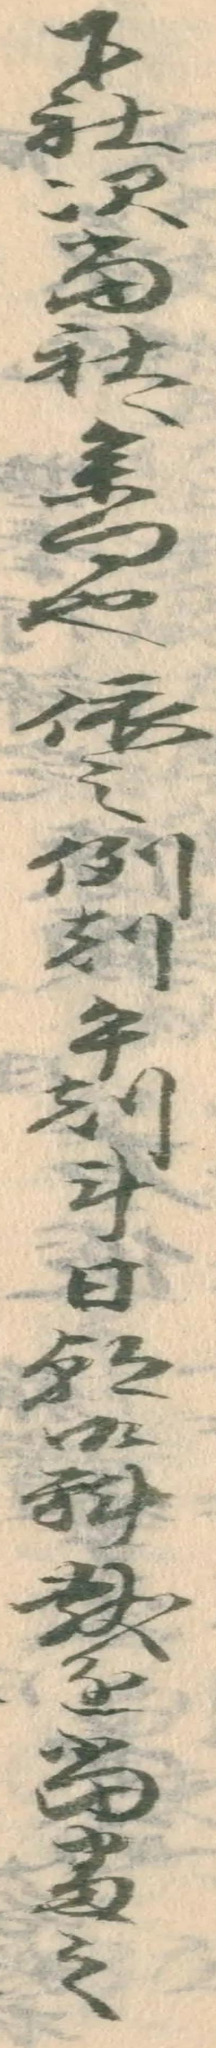下社次当社へ参向也依之例刻午刻計日朝御料献進当番之
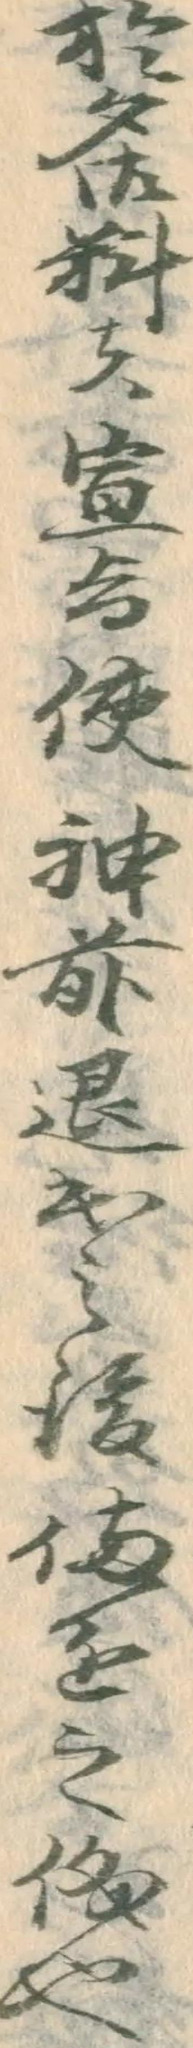於夕御料は宣旨使神前退出之後備進之儀也

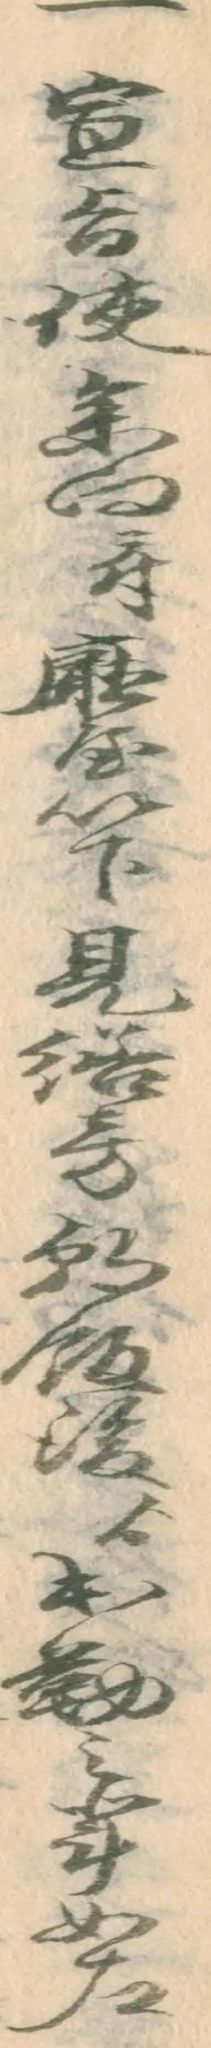一宣旨使参向ニ付庁屋以下見繕方朝飯後ゟ出勤之輩如左
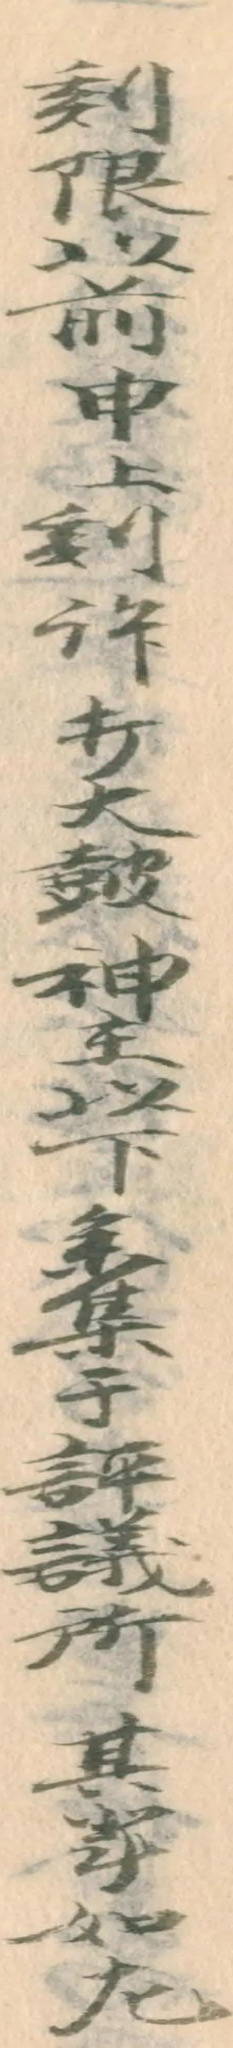一刻限以前申上刻許打大皷神主以下参集于評議所其輩如左
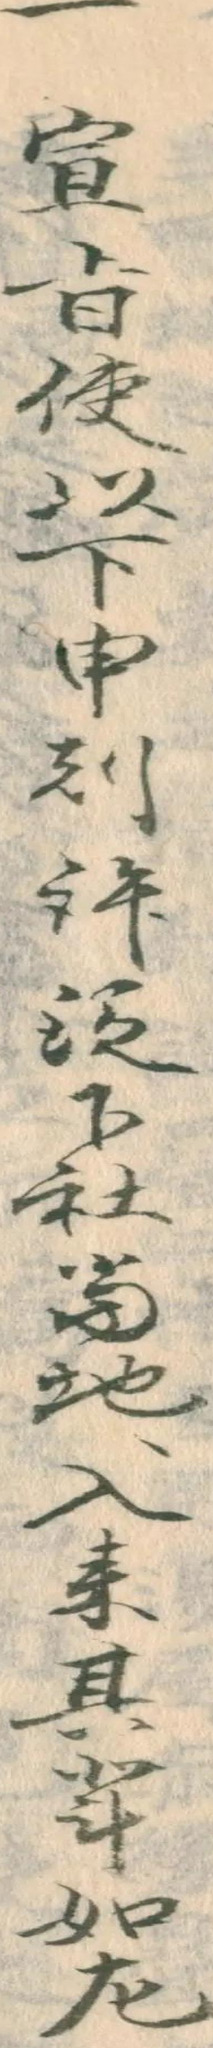一宣旨使以下申刻許従下社当地へ入来其輩如左
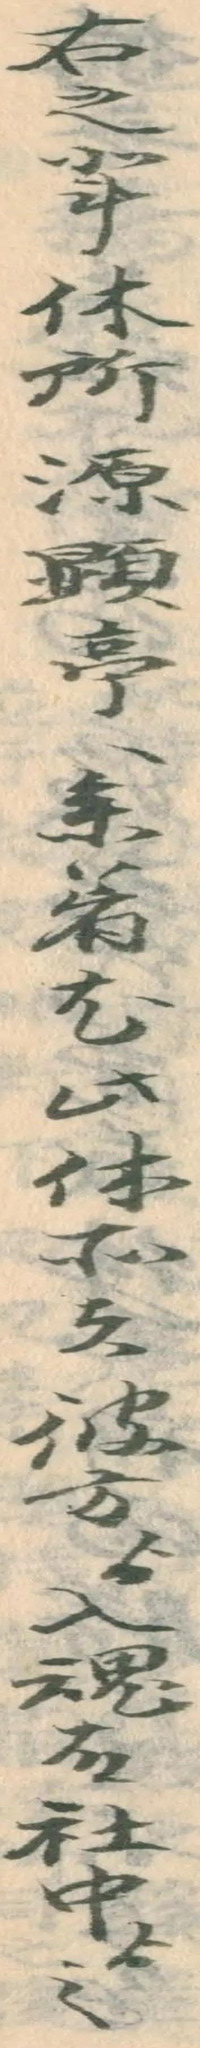右之輩休所源顕亭へ参着尤此休所は彼方ゟ入魂故社中ゟ之

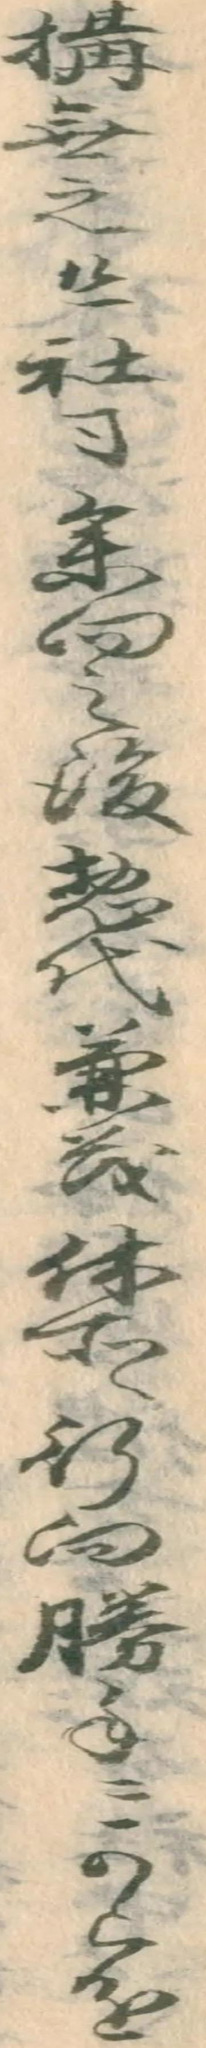構無之且社司参向之後惣代兼茂休所へ行向勝手ニ可被進
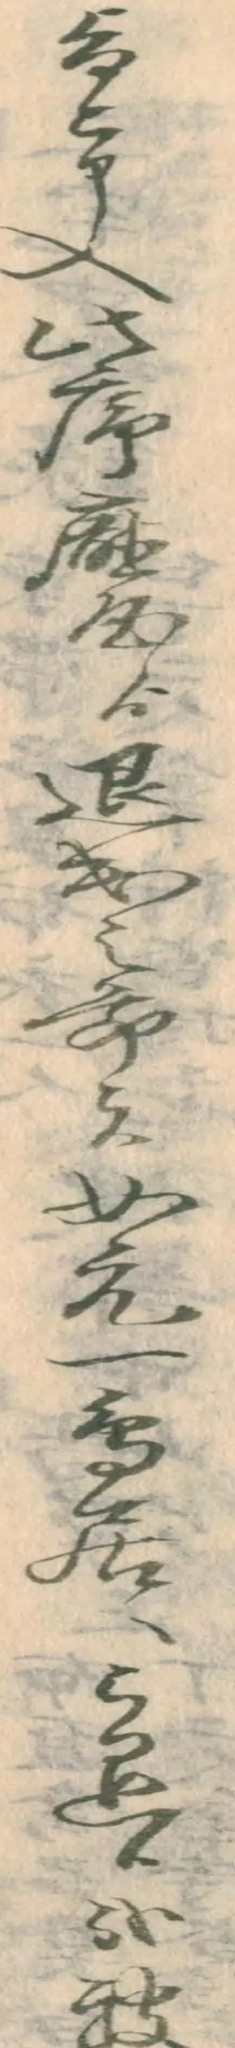旨被申入此序庁屋ゟ退出之節は如元一鳥居へ被退候哉被
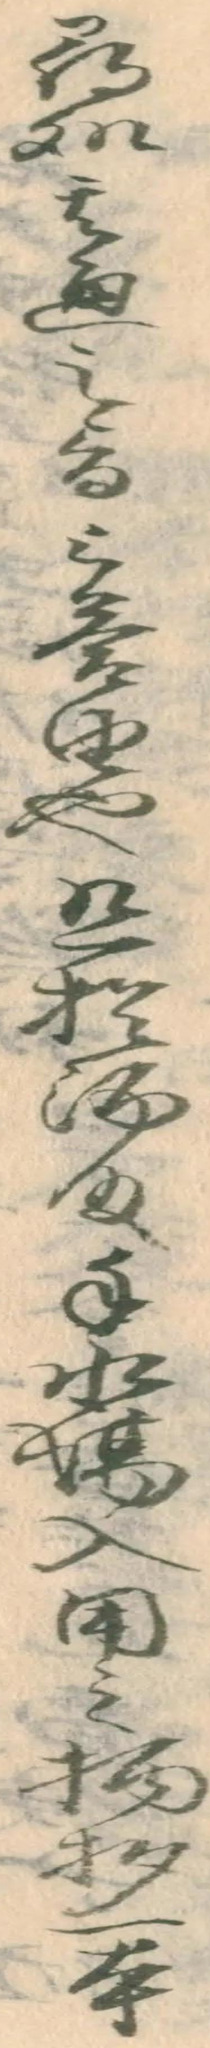尋処其通之旨被答由也且於酒殿手水場入用之柄杓一本
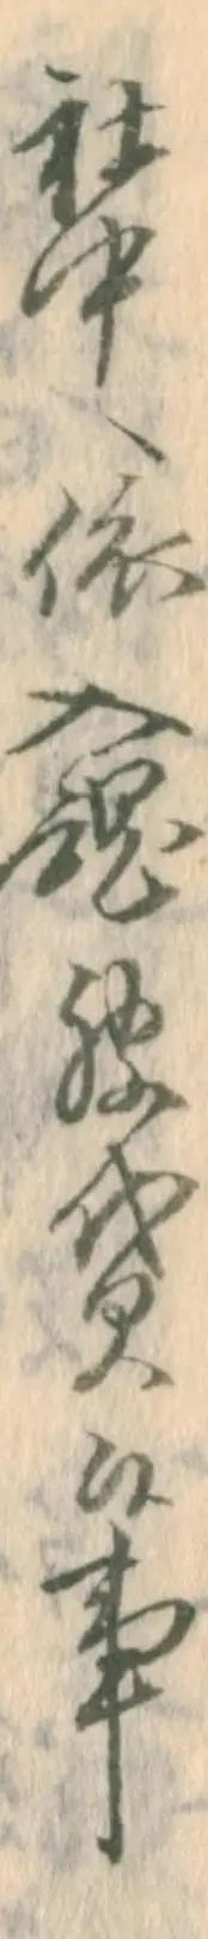社中へ依入魂被貸候事
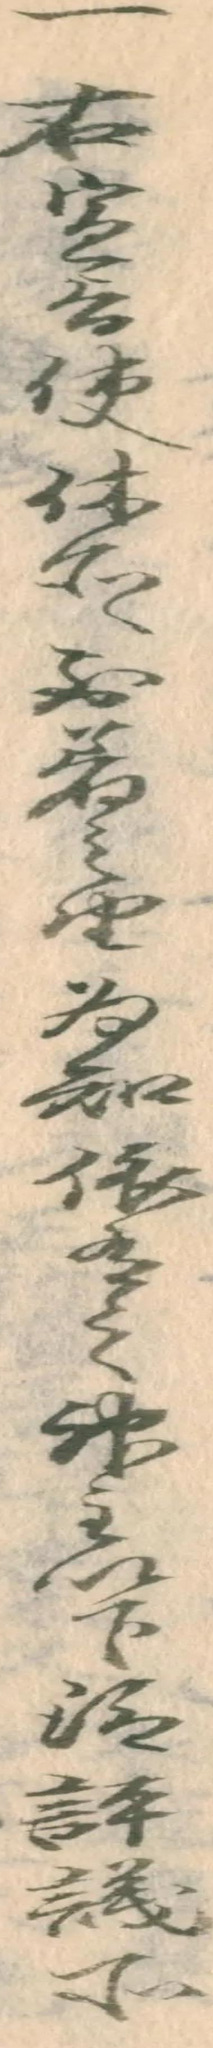一右宣旨使休所へ到着之由為知依有之神主以下従評議所
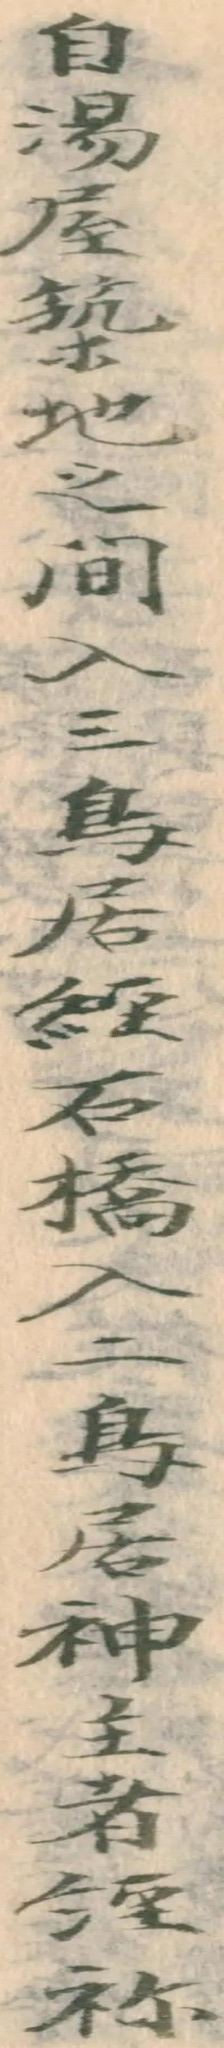自湯屋築地之間入三鳥居経石橋入二鳥居神主者経祢
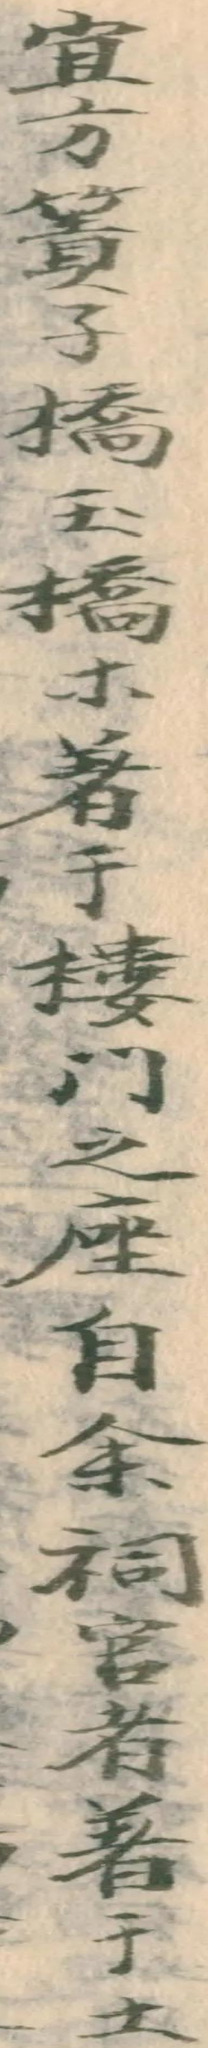宣方簀子橋玉橋等着于楼門之座自余祠官者着于土
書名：賀茂社記録. 第17冊
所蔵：国立国会図書館 National Diet Library, JAPAN
